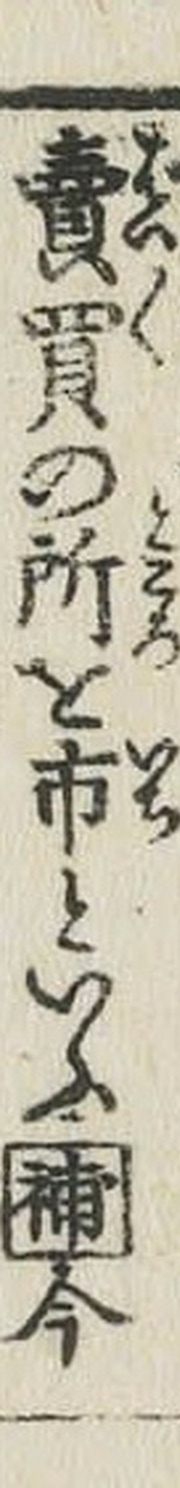売買の所を市といふ補今
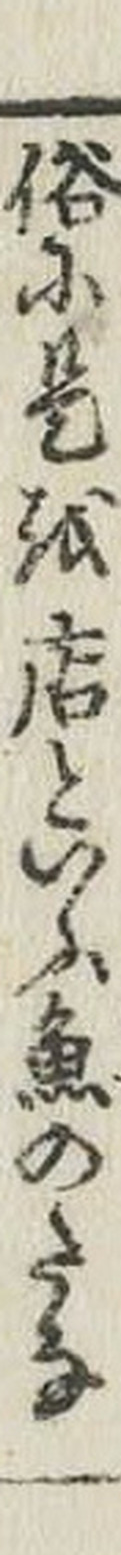俗に是を店といふ魚のたな
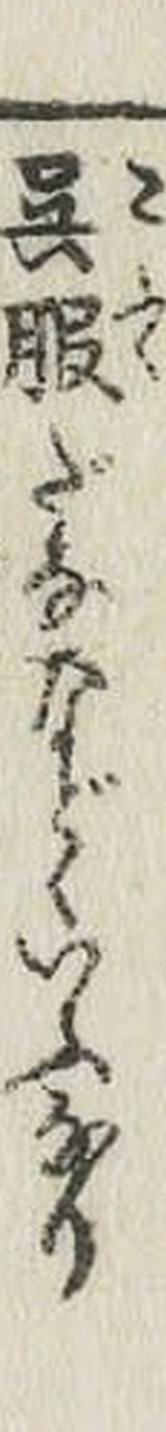呉服だななどゝいふなり
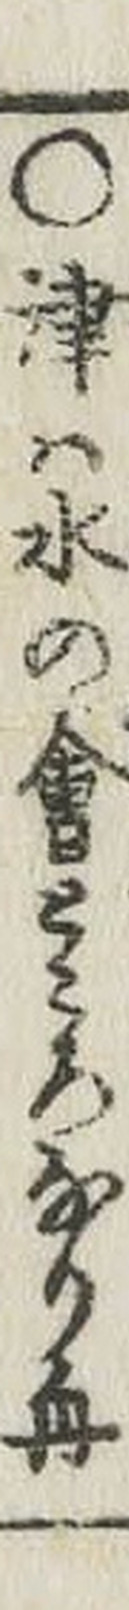○津は水の会ところなり舟
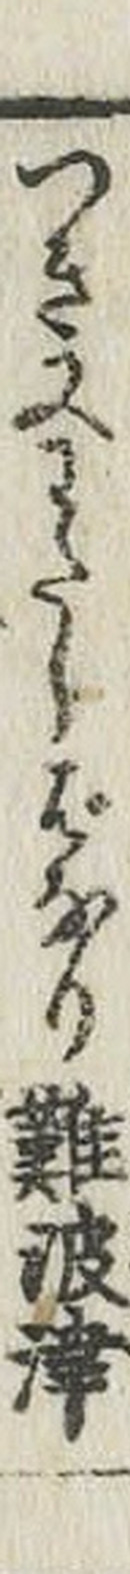つき又わたしばなり難波津
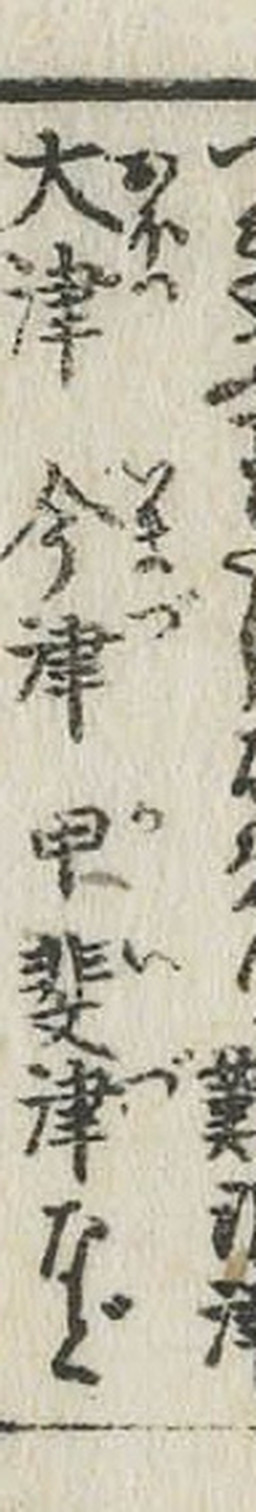大津今津甲斐津など
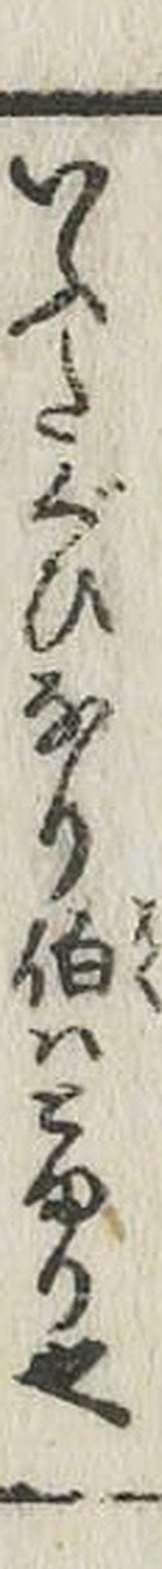いふたぐひなり伯はとまり也
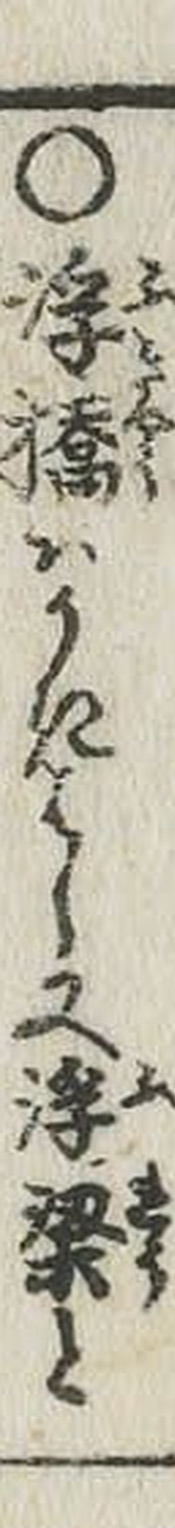○浮橋はうきはし又浮梁と
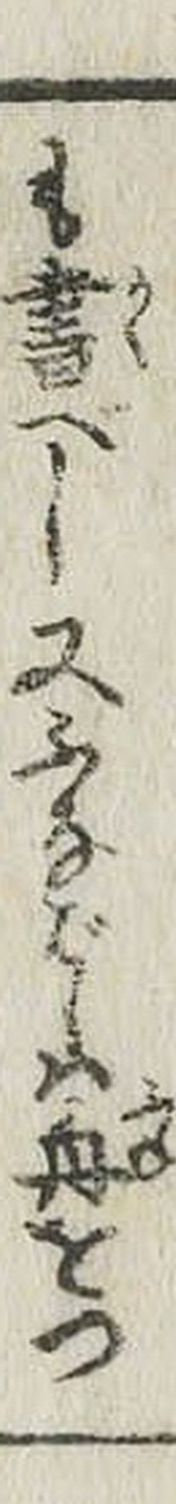も書べし又ふなばしは舟をつ
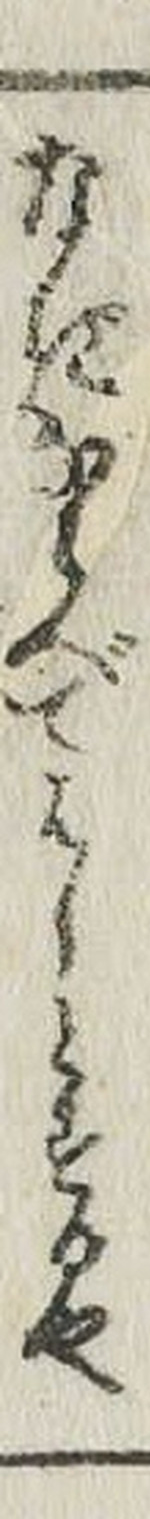なぎならべてはしとする也
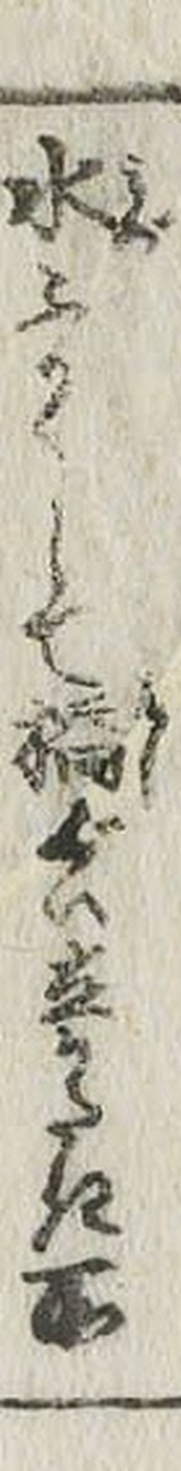水ふかくして橋ぐい立かたき所
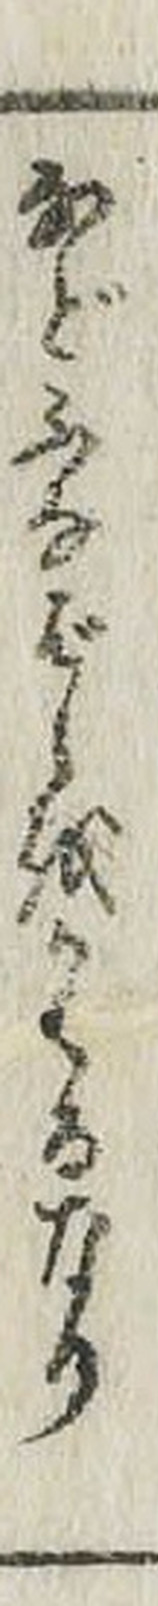などふなばしをかくるなり
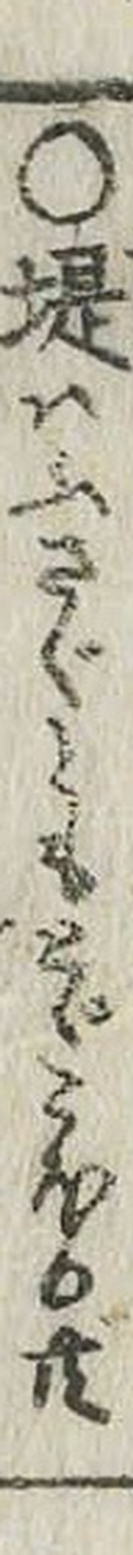○堤はふさぐともとゞこほる共
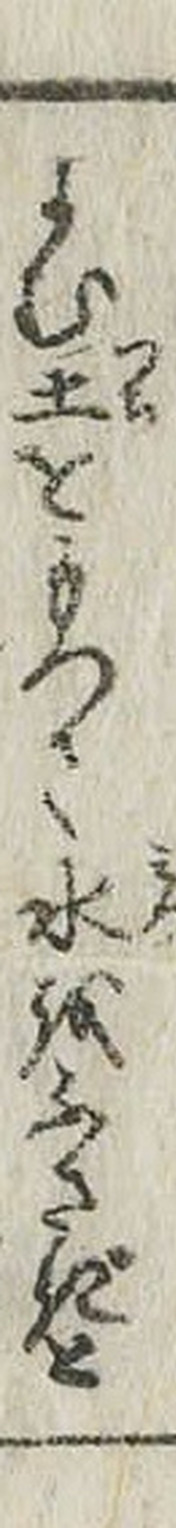よむ土をもつて水をふさぎと
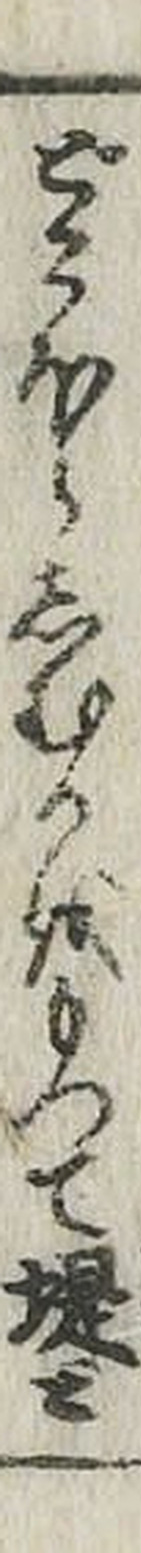どこほらしむるをもつて堤と
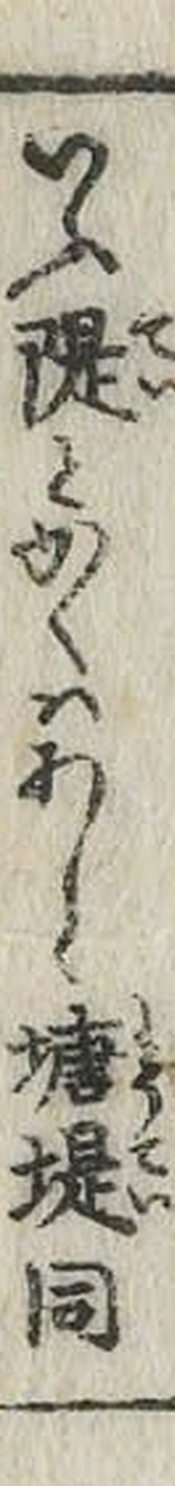いふ隄かくはあしゝ塘堤同
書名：増補頭書訓蒙図彙大成 10巻 2:巻之1-3
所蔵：東京学芸大学教育コンテンツアーカイブ
